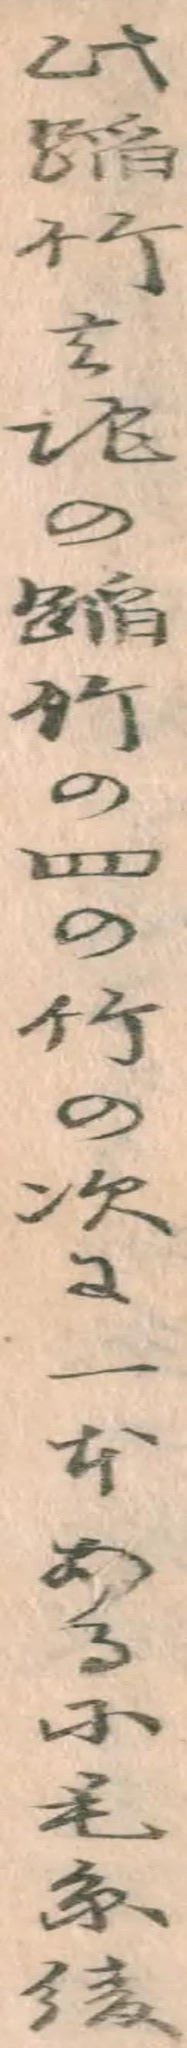此蹈竹は地の蹈竹の四の竹の次に一本あるに毛糸綾
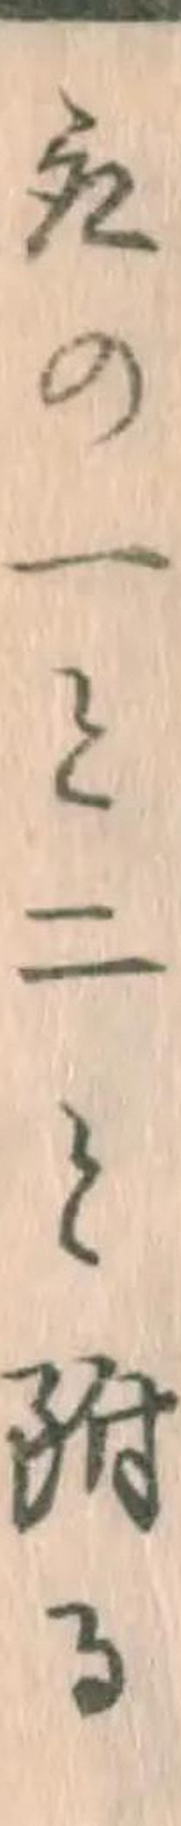取の一と二と附る
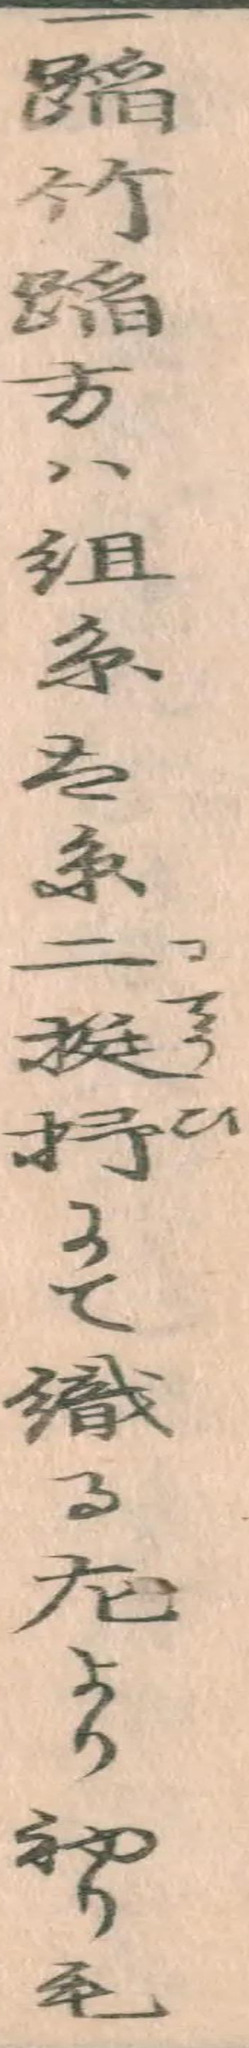一蹈竹蹈方は組糸太糸二挺杼にて織る左より初り毛
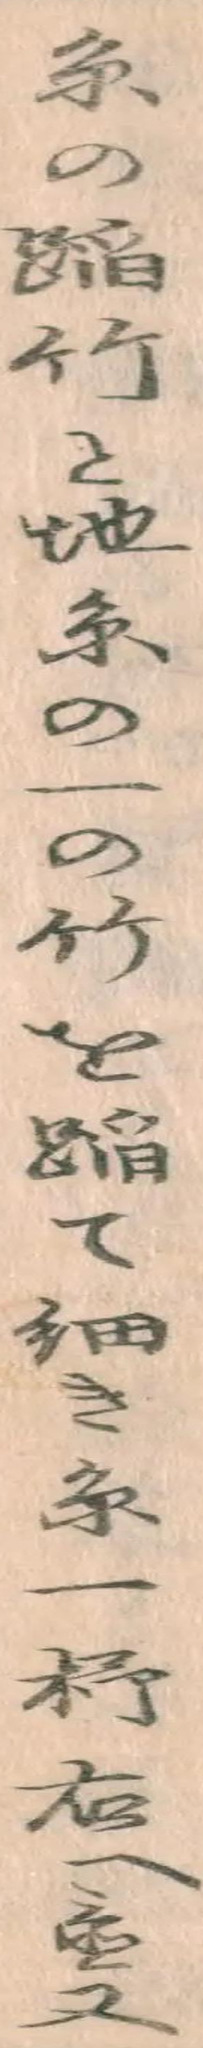糸の蹈竹と地糸の一の竹を蹈て細き糸一杼右へ置又
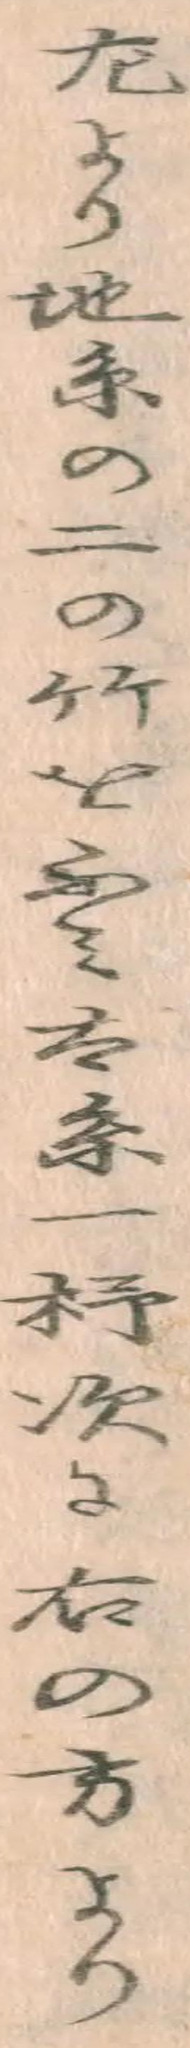左より地糸の二の竹をふみ太糸一杼次に右の方より
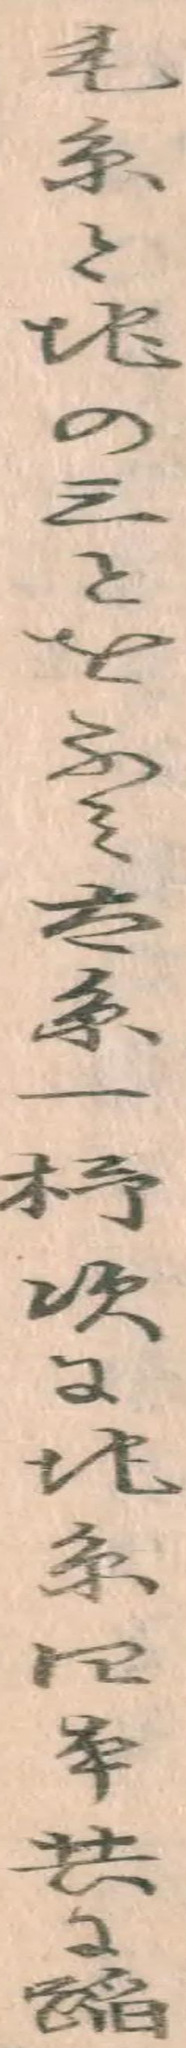毛糸と地の三とをふみ太糸一杼次に地糸四本共に蹈
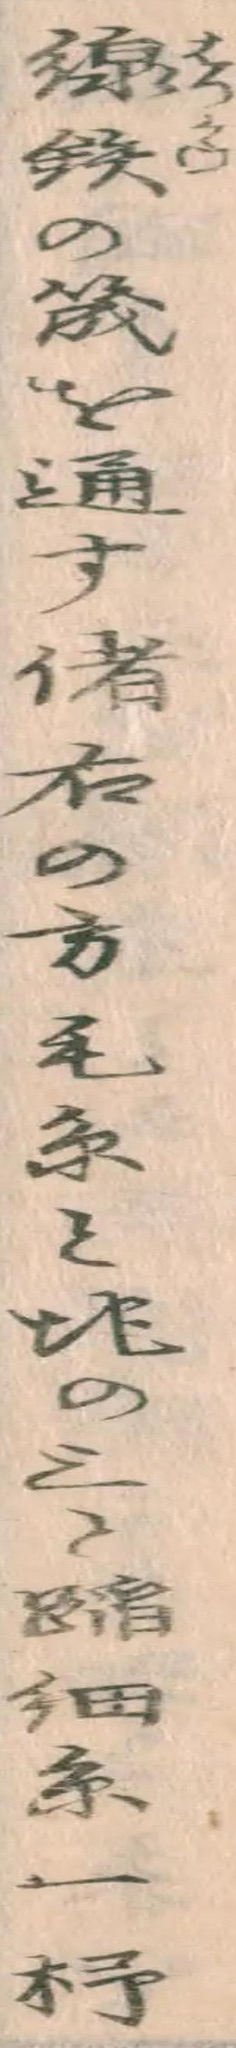線鉄の筬を通す偖右の方毛糸と地の三と蹈細糸一杼
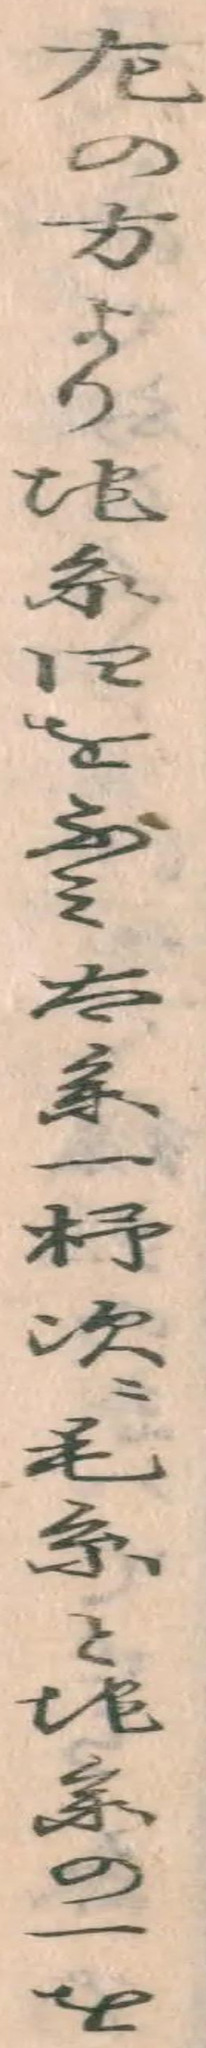左の方より地糸四をふみ太糸一杼次に毛糸と地糸の一を
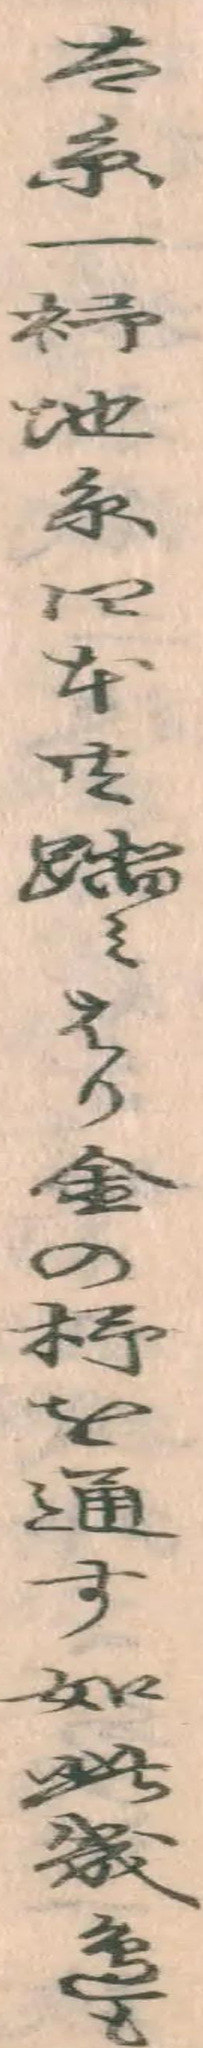太糸一杼地糸四本共蹈みはり金の杼を通す如此幾辺も
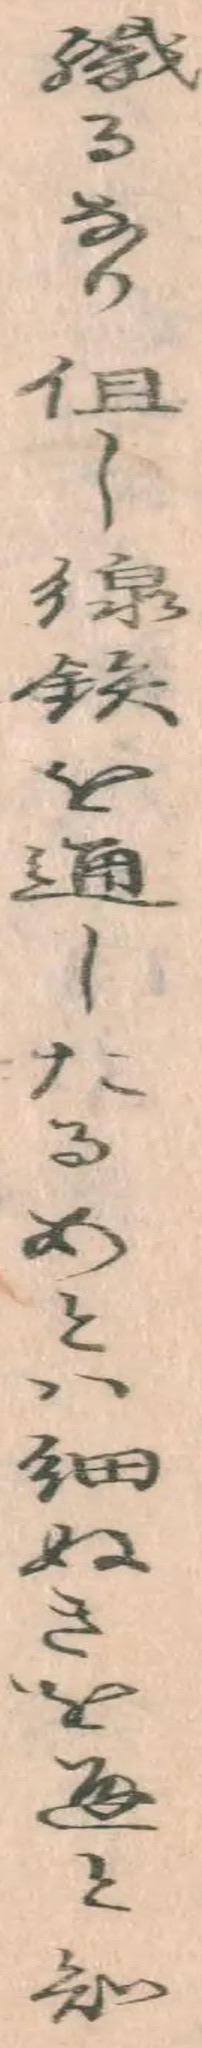織るなり但し線鉄を通したるあとは細ぬきを通と知
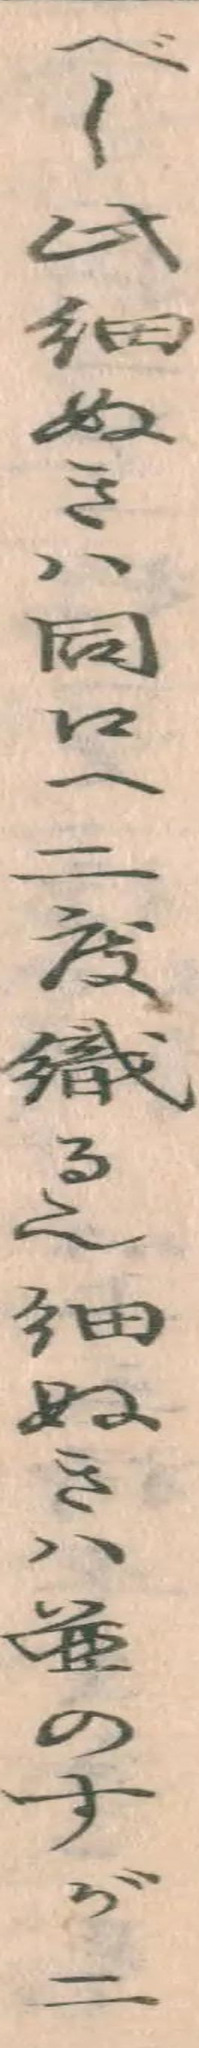べし此細ぬきは同口へ二度織る也細ぬきは並のすが二
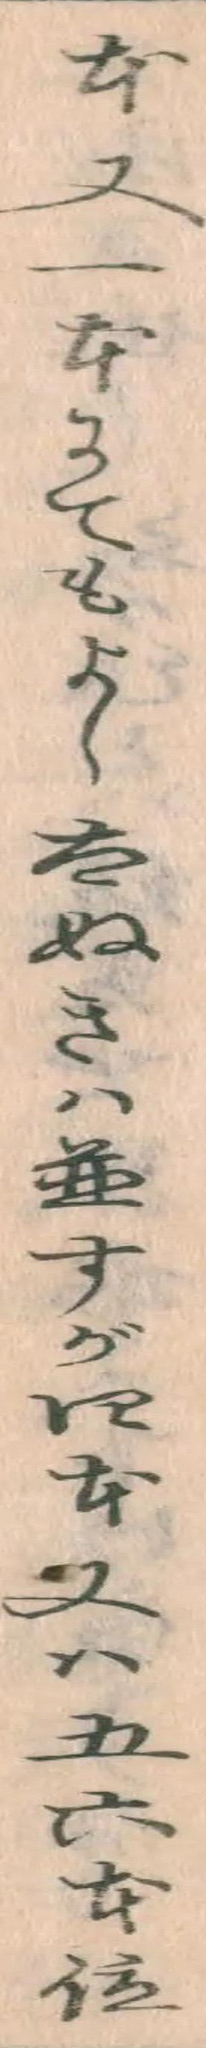本又一本にてもよし太ぬきは並すが四本又は五六本位
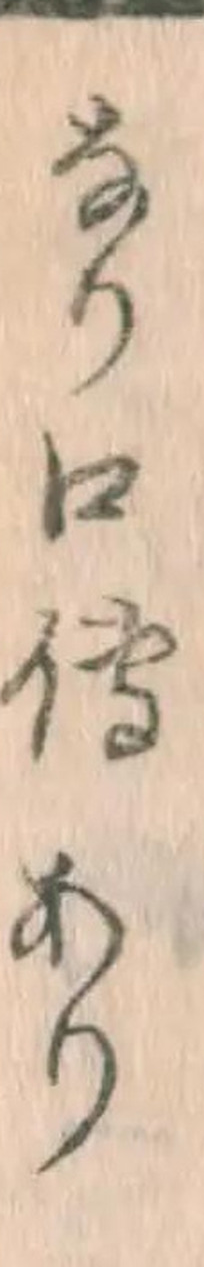なり口伝あり
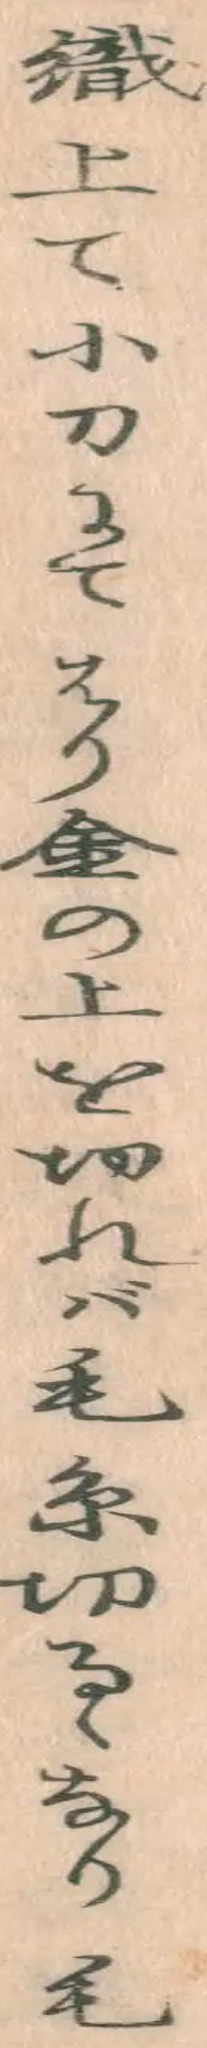一織上て小刀にてはり金の上を切れば毛糸切るゝなり毛
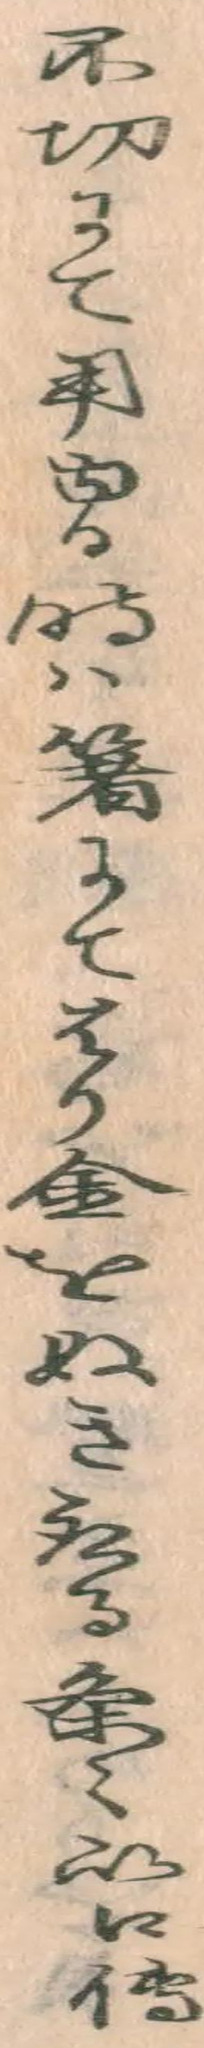不切にて用ゆる時は箸にてはり金をぬき取る条々以口伝
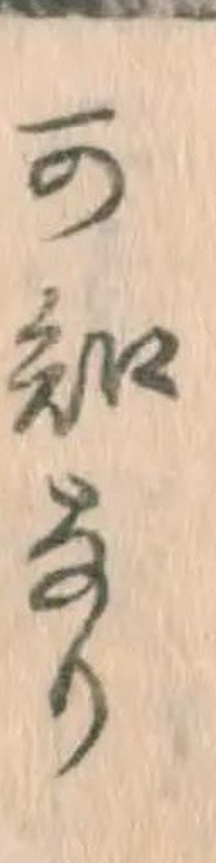可知なり
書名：機織彙編 5巻. [2]
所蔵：国立国会図書館 National Diet Library, JAPAN
